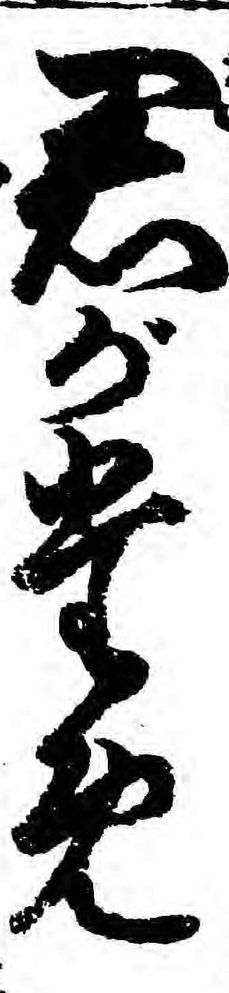君がため
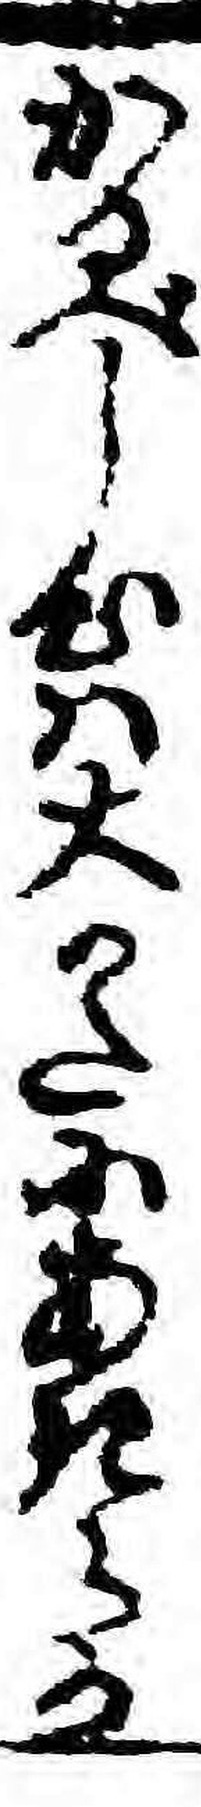かるべし心は大かたにあきらか
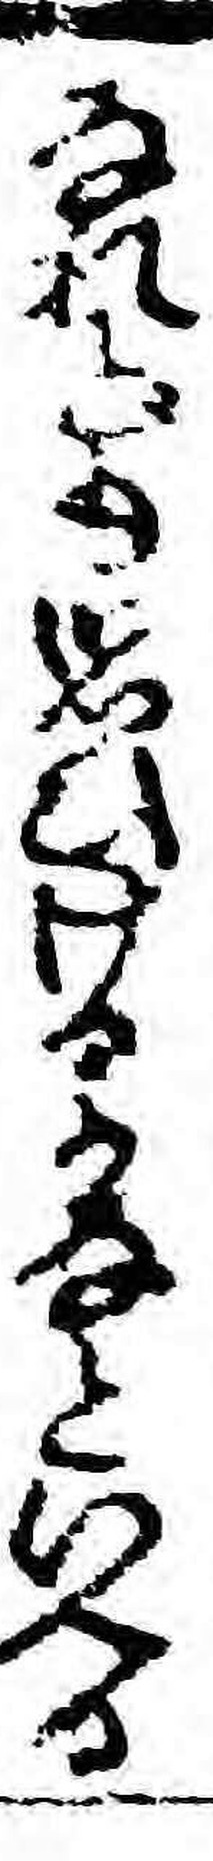なれども思ひけるかなといへる
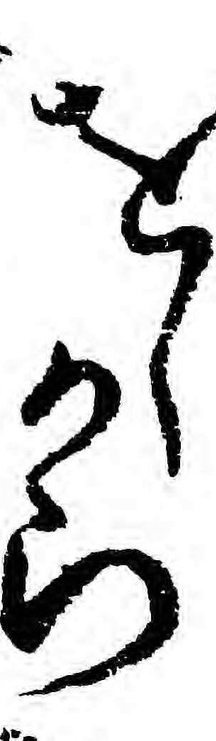をしから
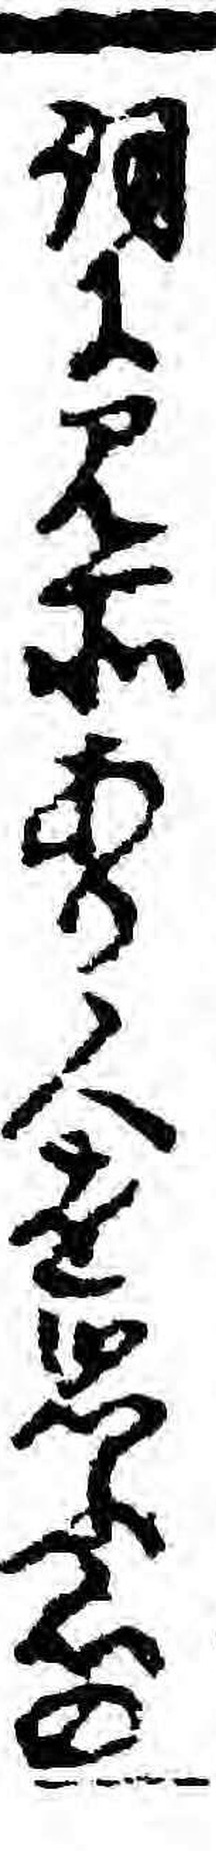詞に見所あり人を思ふ心の
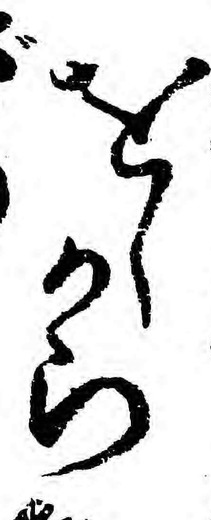をしから
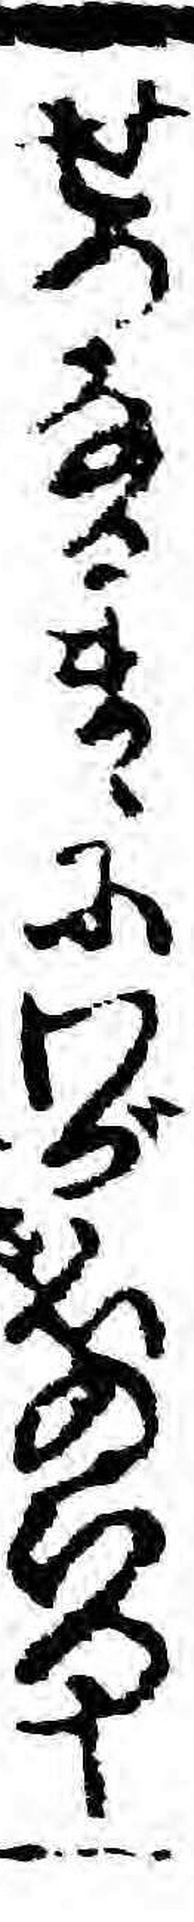せつなるまゝにわが心のいつし
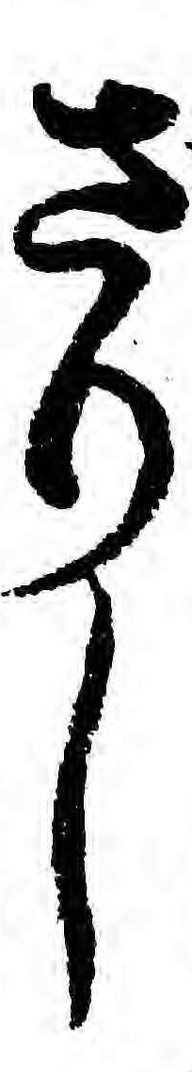ざりし
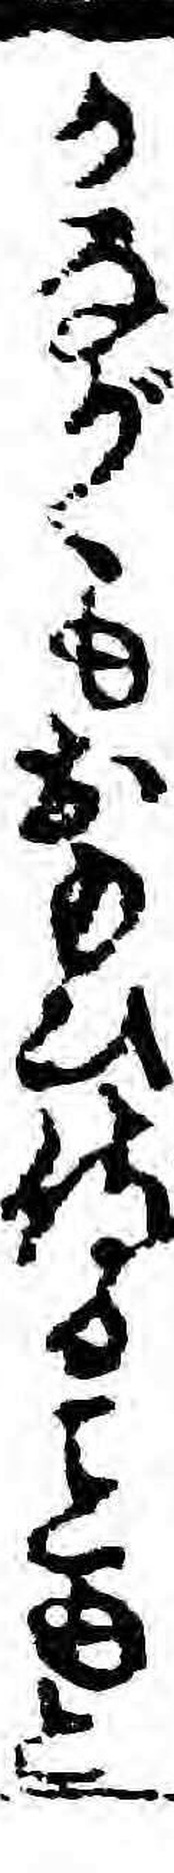かながくもおもひ侍ることもと
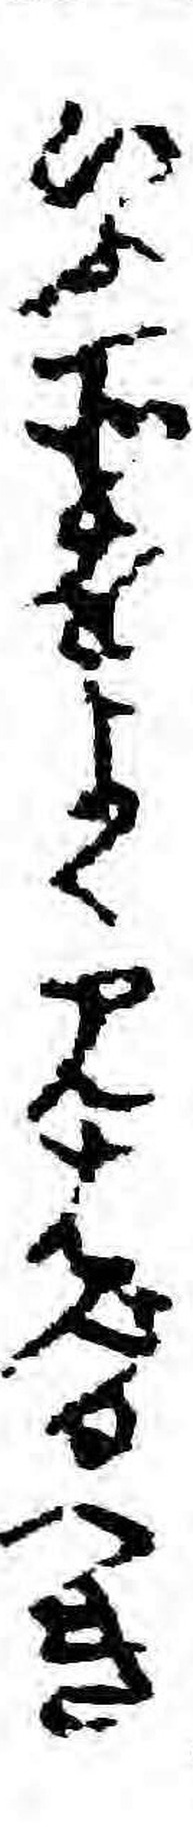いふ所をよく見はべるへき
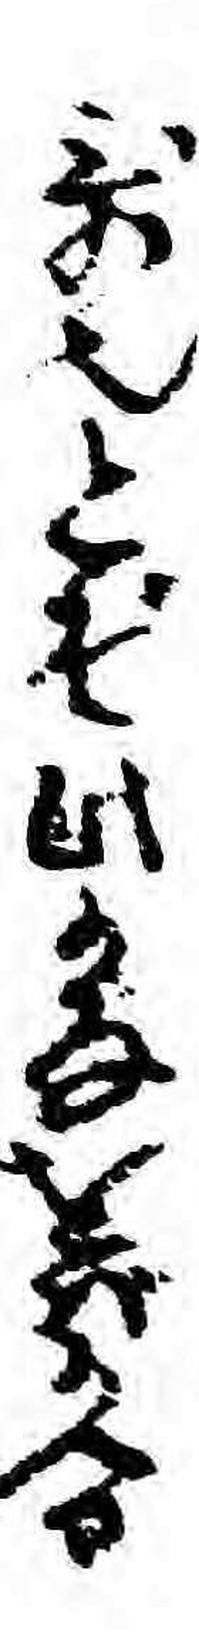哥也とぞ此かなをばかへる
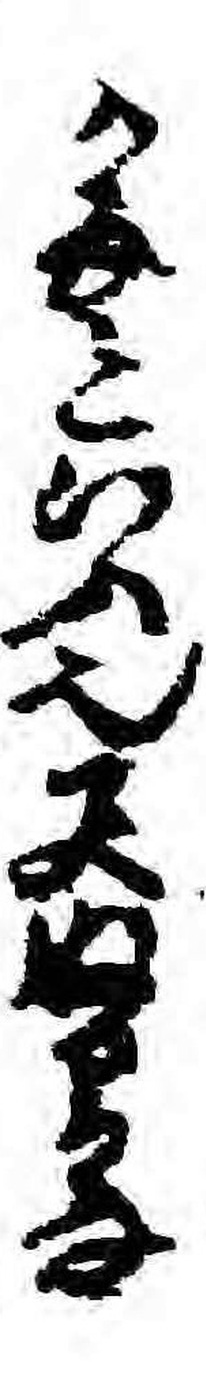かなといふ也又ぬるかな
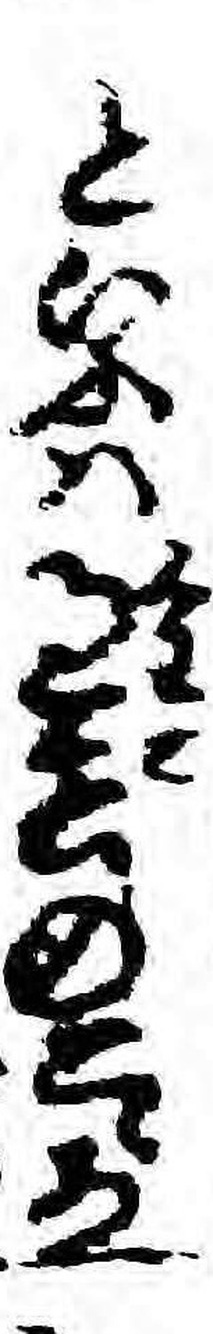といふは過去のこゝろ
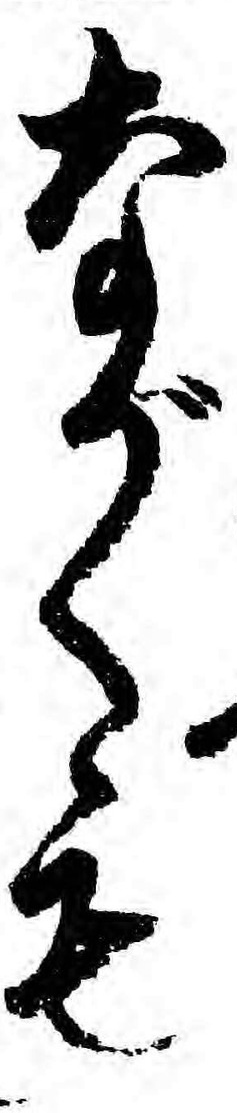ながくも
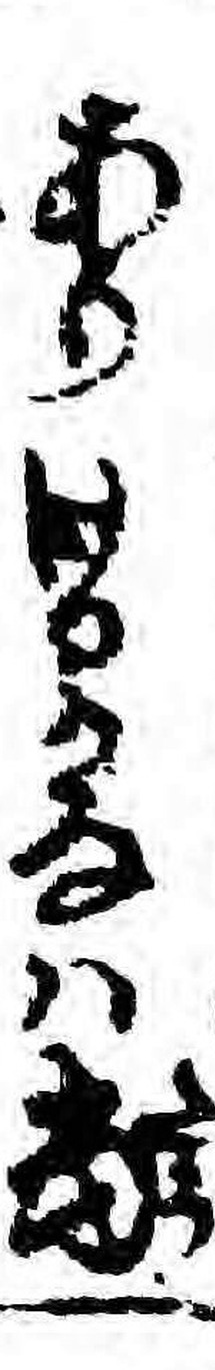ありけるかなは当
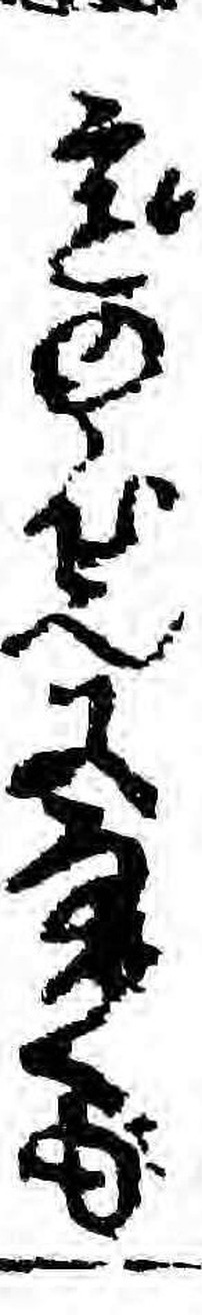意の心也又ながくも
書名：頭書和歌注譯／壽賀多百人一首小倉錦
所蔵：国文学研究資料館
